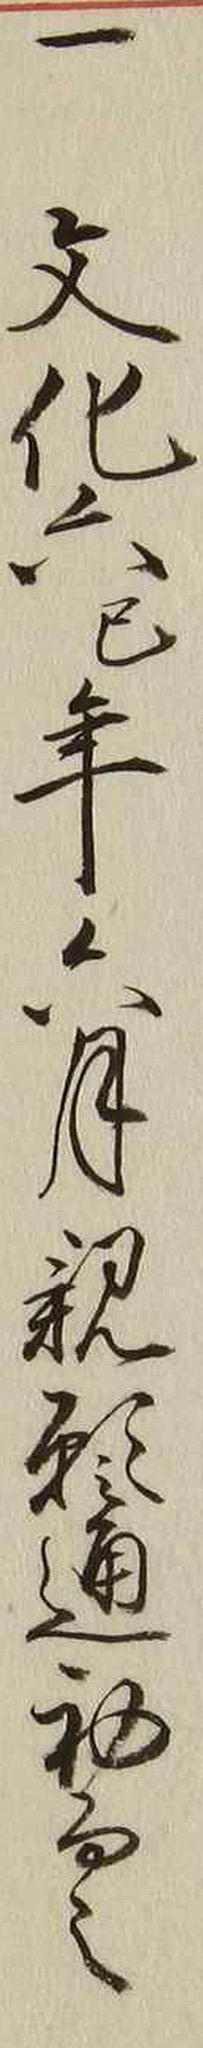一文化六巳年六月親願之通初而之
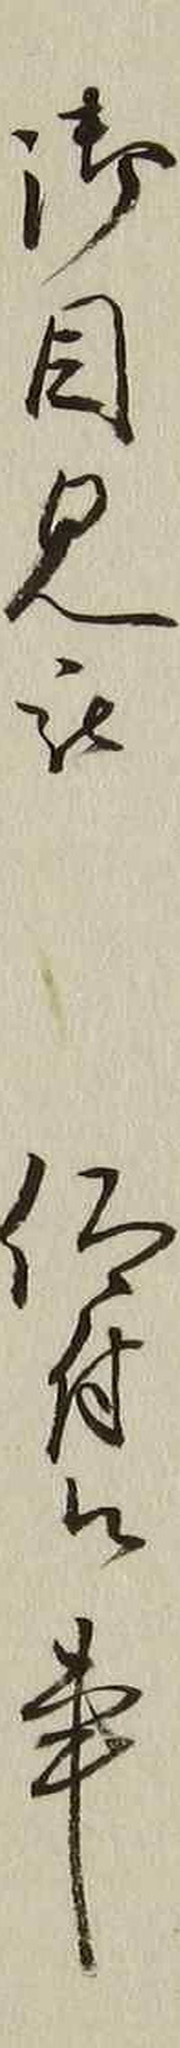御目見被仰付侯事
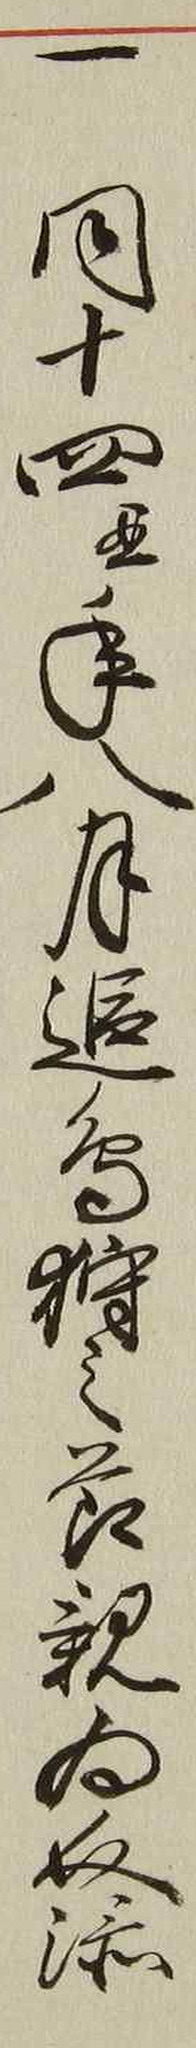一同十四丑年八月追鳥狩之節親為介添
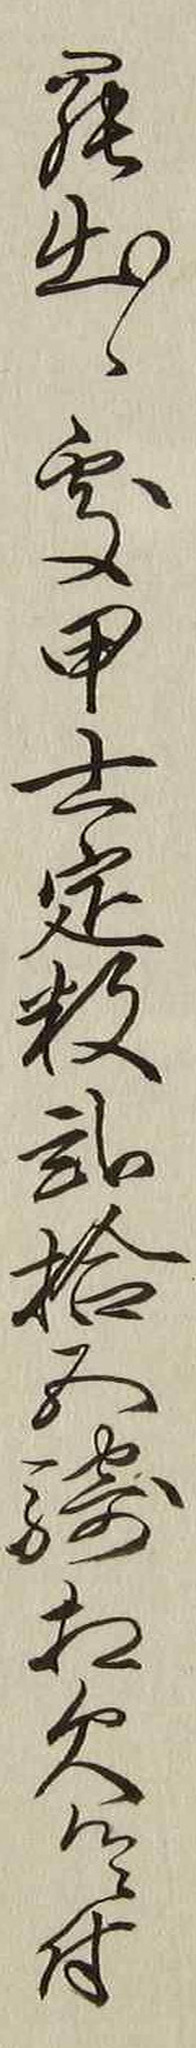罷出候処甲士定数弐拾五騎相欠候ニ付
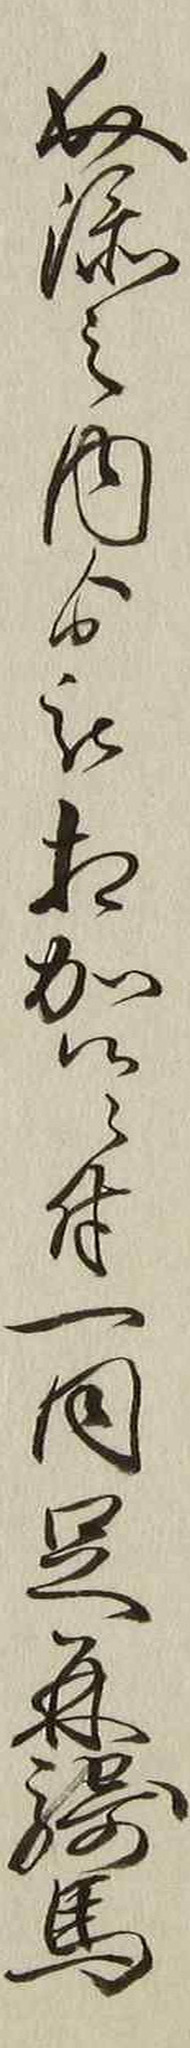介添之内ゟ被相加候ニ付一同足并騎馬
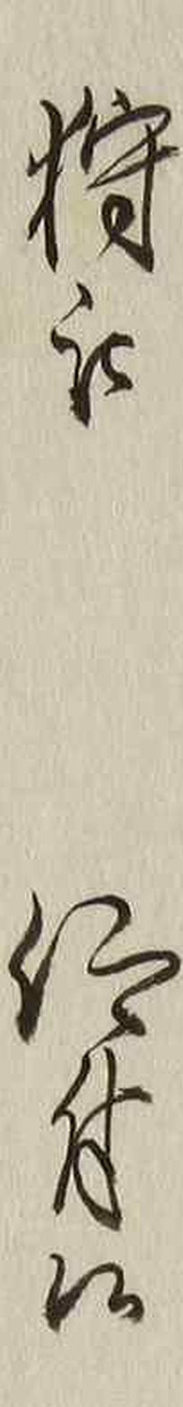狩被仰付候
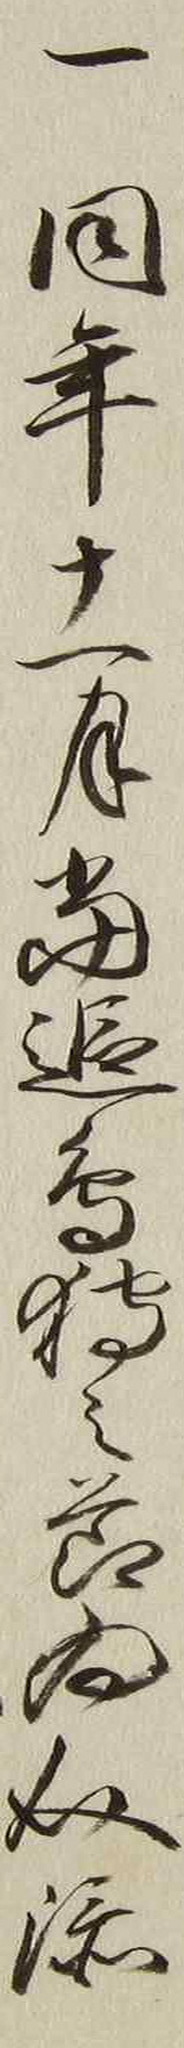一同年十一月当追鳥狩之節為介添
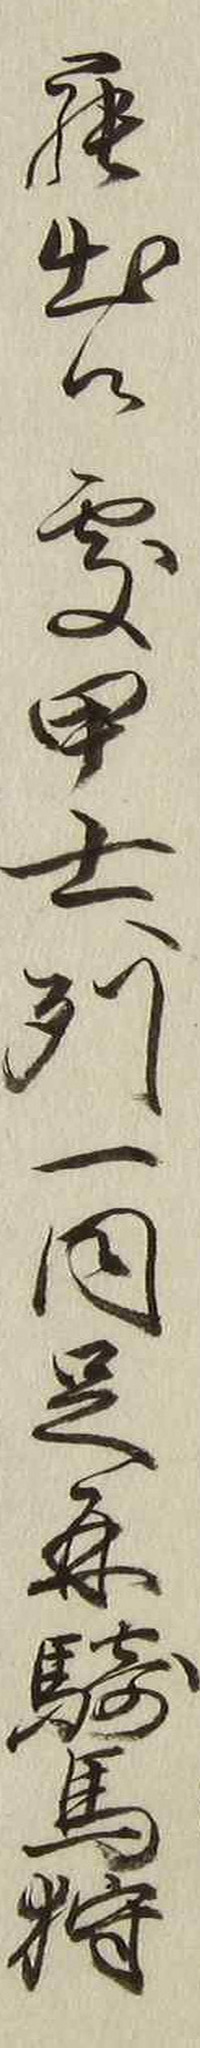罷出候処甲士へ列一同足并騎馬狩
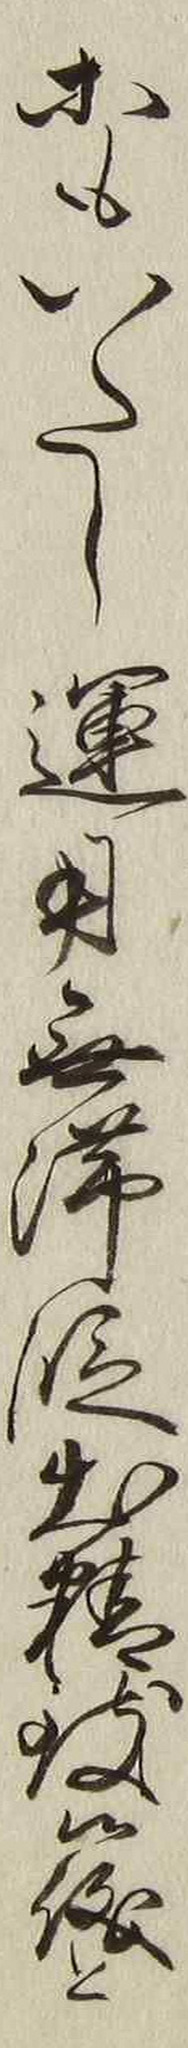等もいたし運用無滞段出精致候儀と
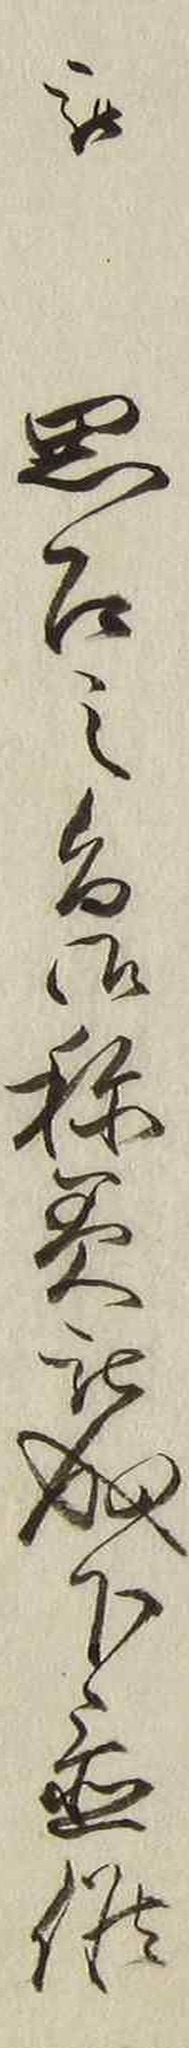被思召之旨御称美被成下置候
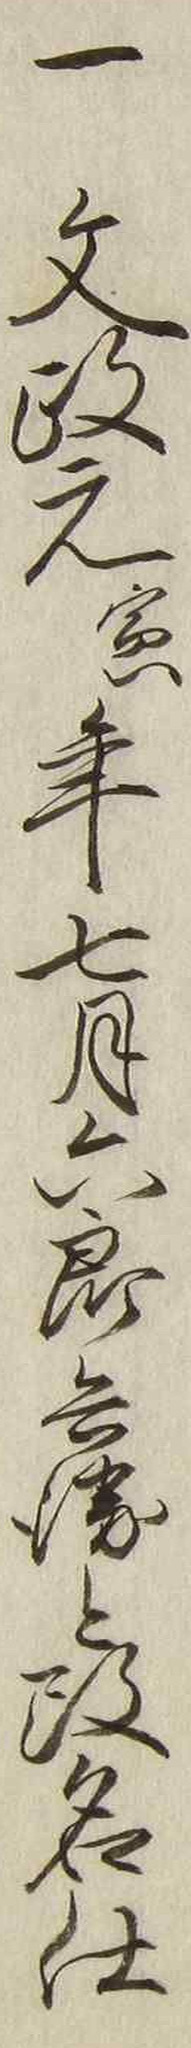一文政元寅年七月六郎兵衛と改名仕

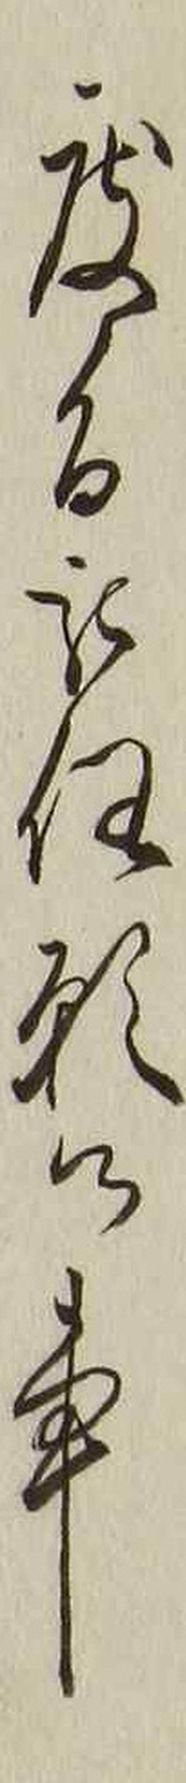度旨被任願候事
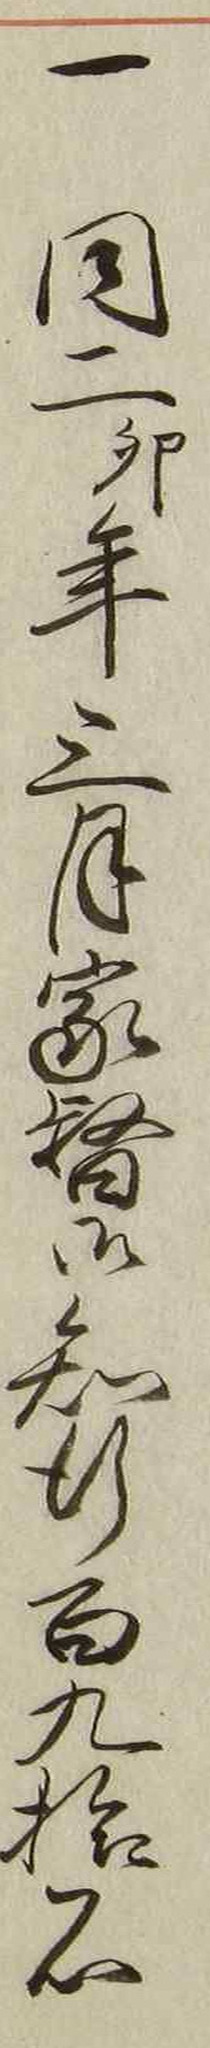一同二卯年三月家督御知行百九拾石
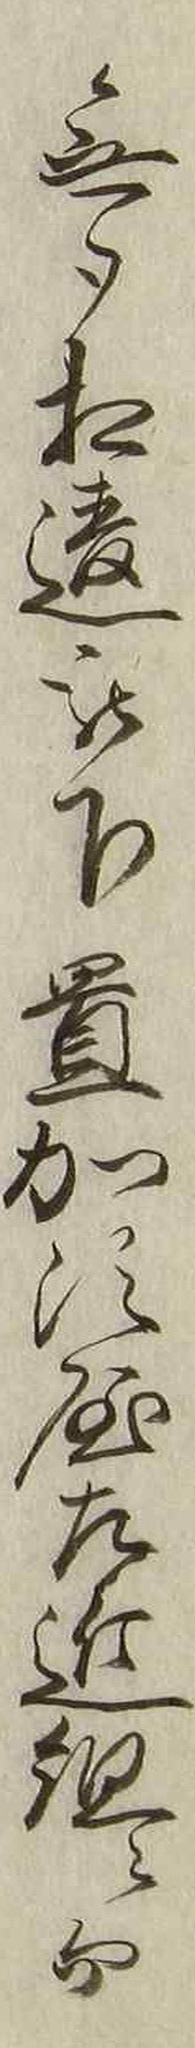無御相違被下置加次屋左近組ニ而
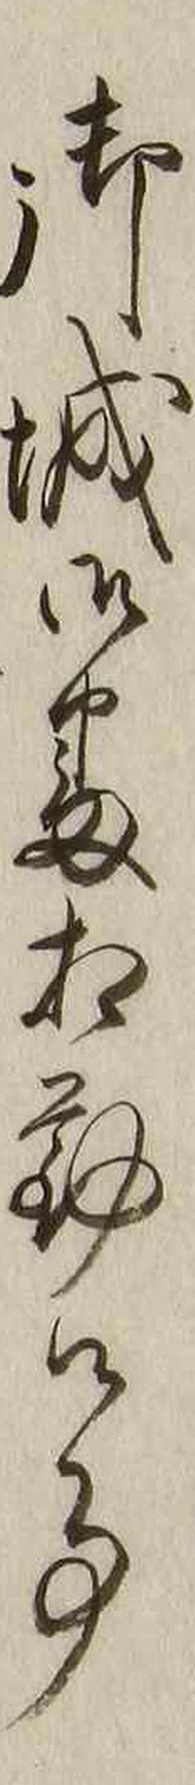御城御番相勤候事
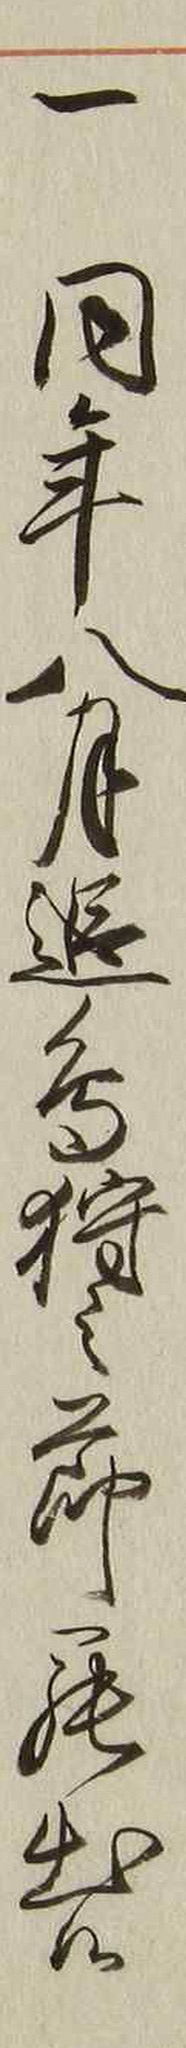一同年八月追鳥狩之節罷出候
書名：諸士系譜　巻之21　い之部21
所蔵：会津若松市立会津図書館
